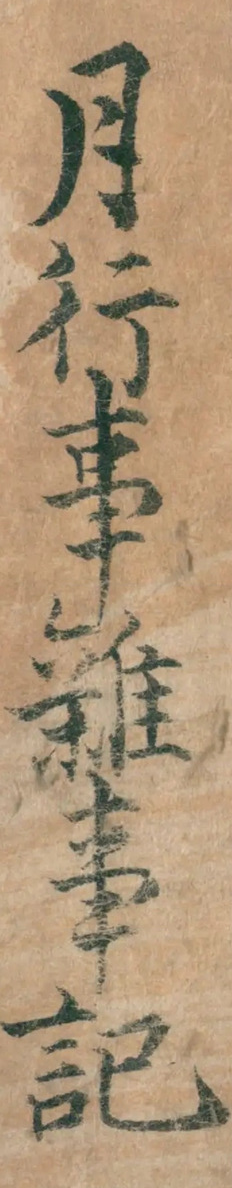月行事雑事記

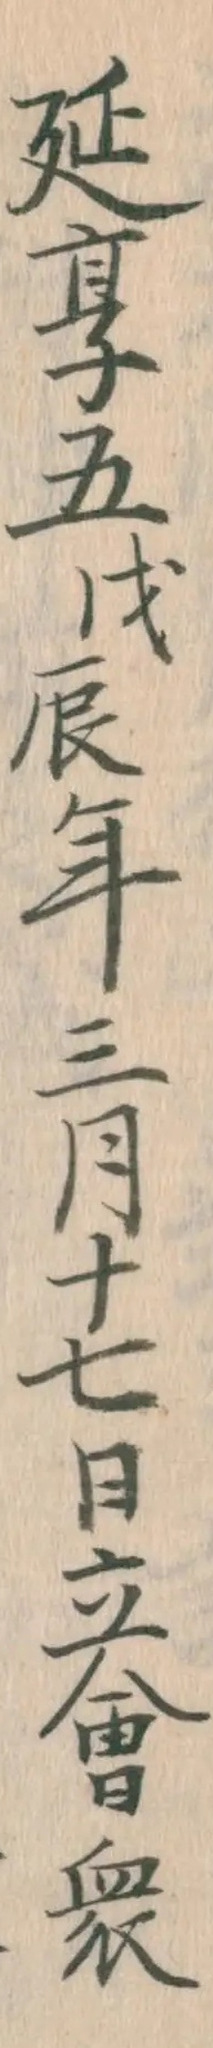延享五戊辰年三月十七日立会衆
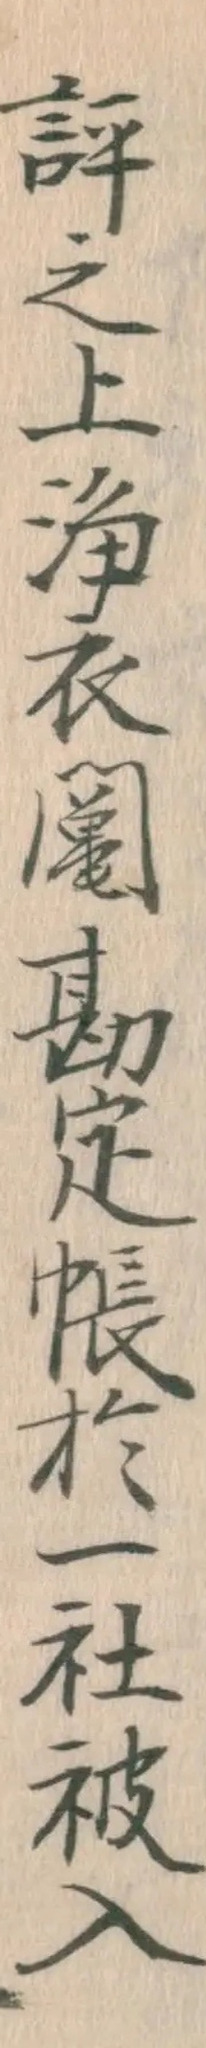評之上浄衣鬮勘定帳於一社被入
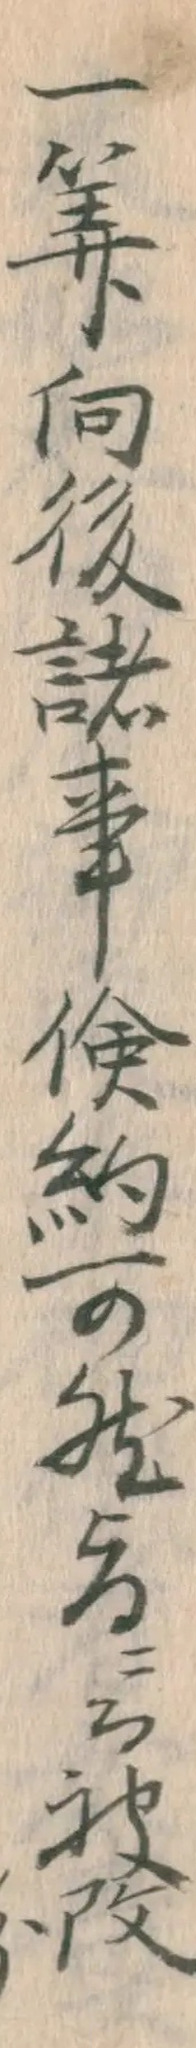一算向後諸事倹約可然旨ニ而被改分
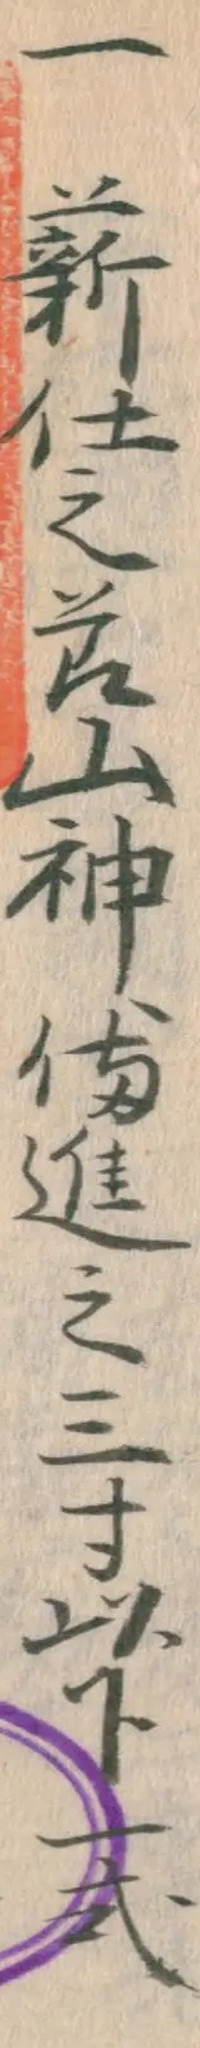一薪仕之節山神へ備進之三寸以下一式
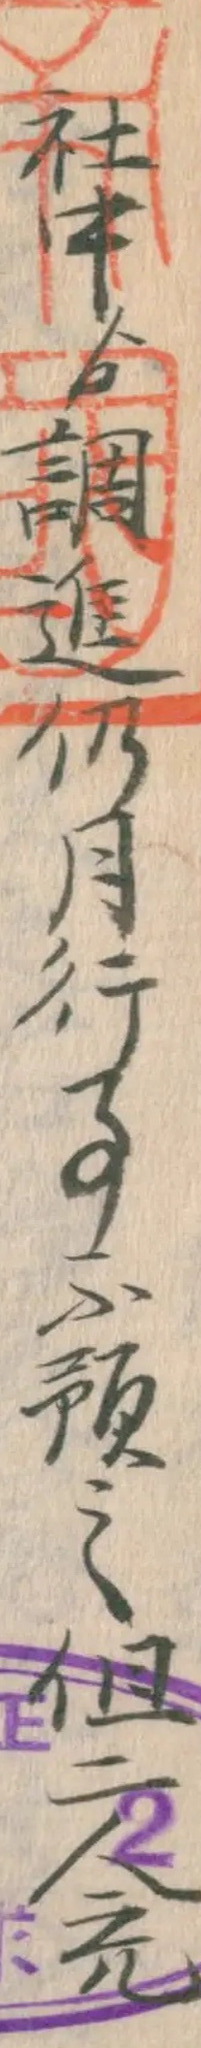社中ゟ調進仍月行事不預之但二人充
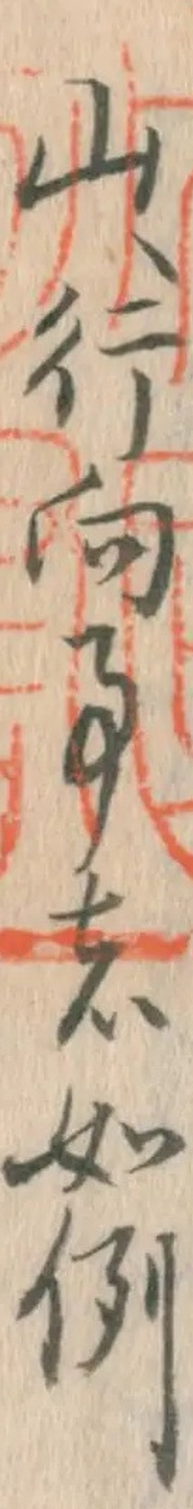山へ行向事者如例
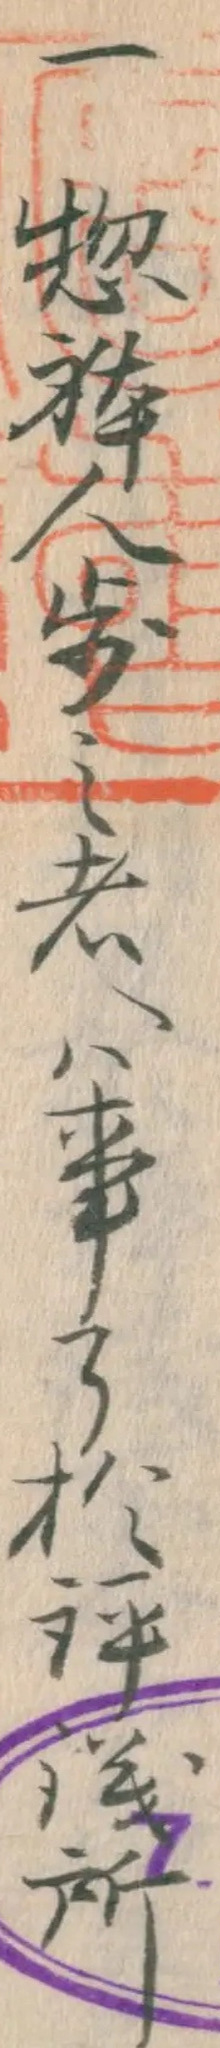一惣体人歩之者へは事了於評議所
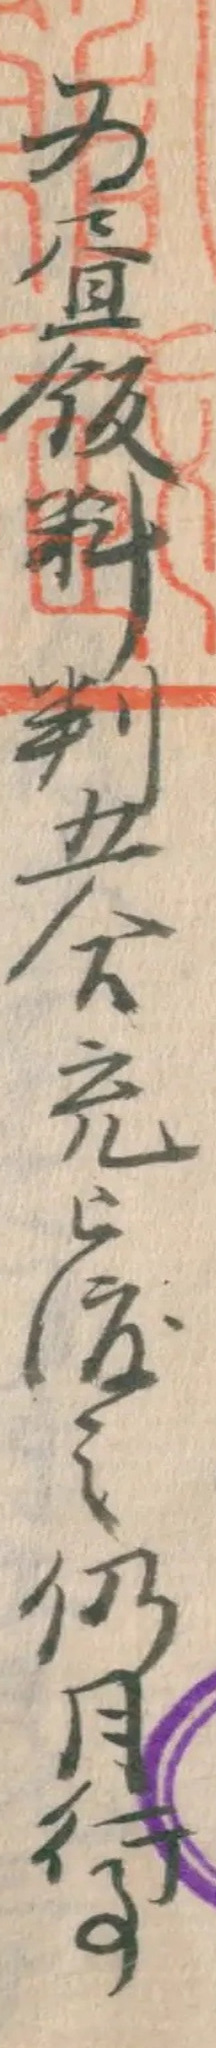為昼飯料判五合充被渡之仍月行事
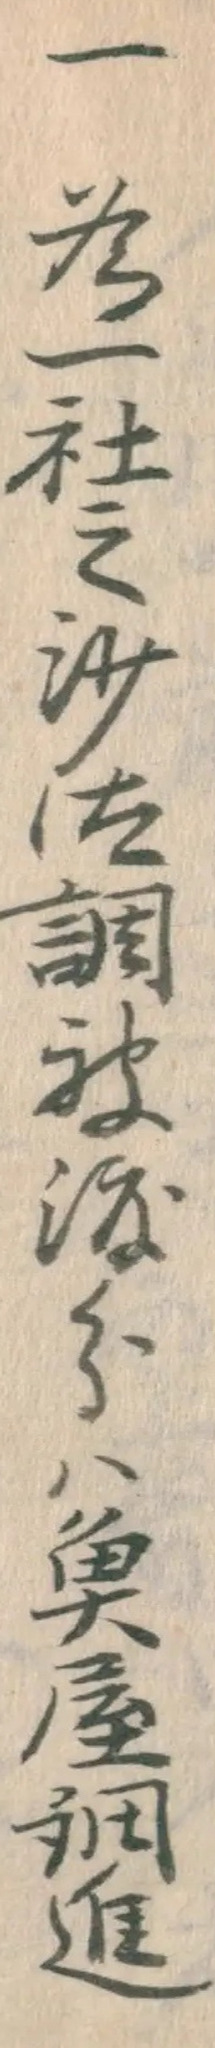一為一社之沙汰調被渡分は魚屋調進
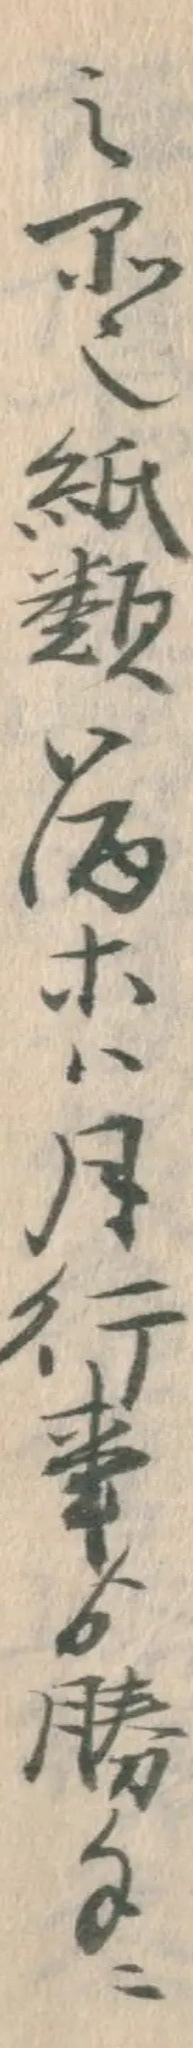之品也紙類御酒等は月行事ゟ勝手に
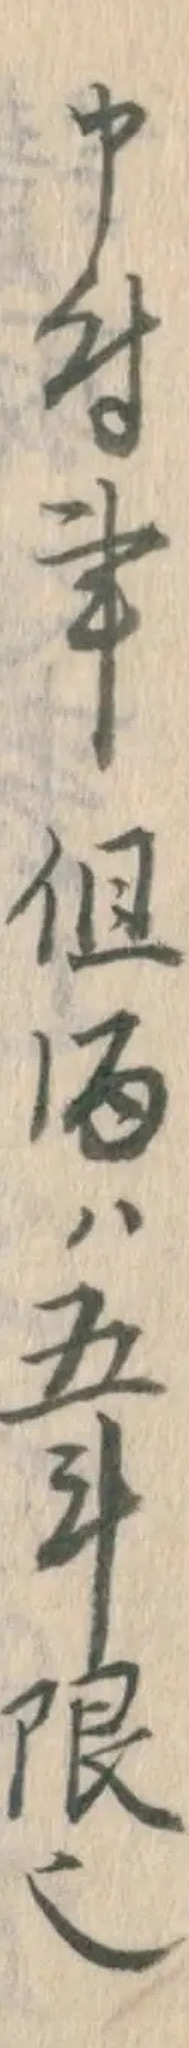申付事但酒は五斗限也
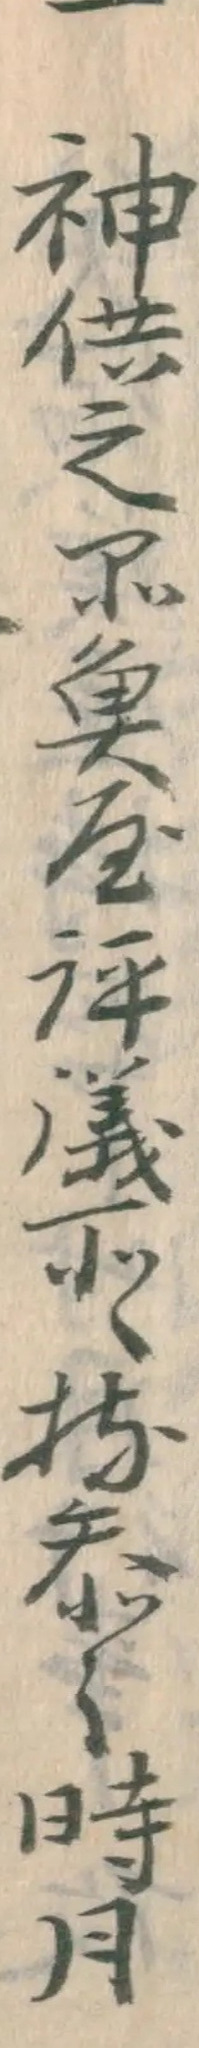一神供之品魚屋評議所へ持参之時月
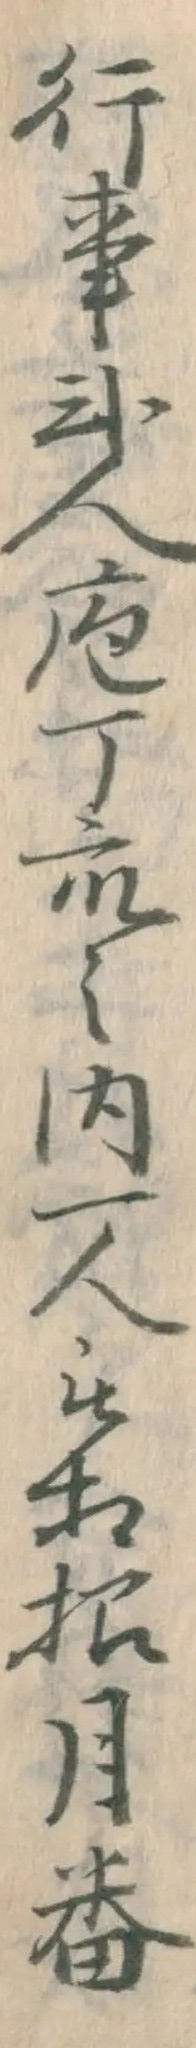行事弐人庖丁衆之内一人被相招月番

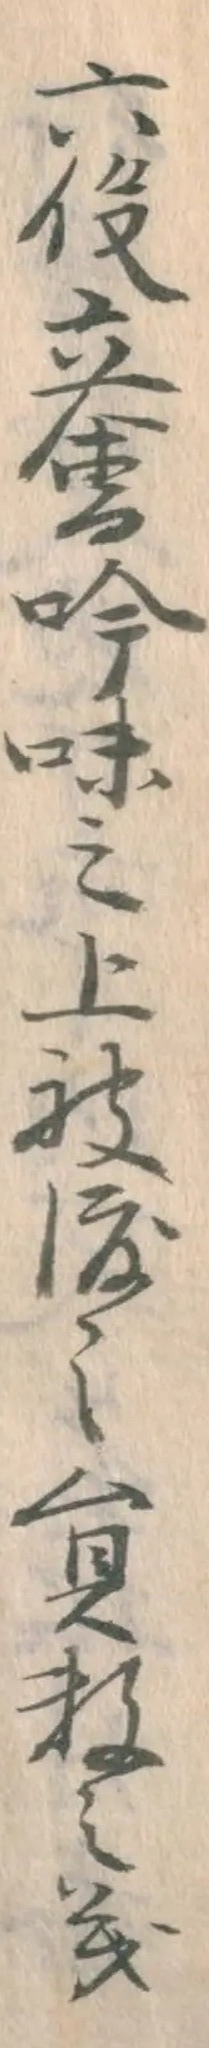六役立会吟味之上被渡之員数之義
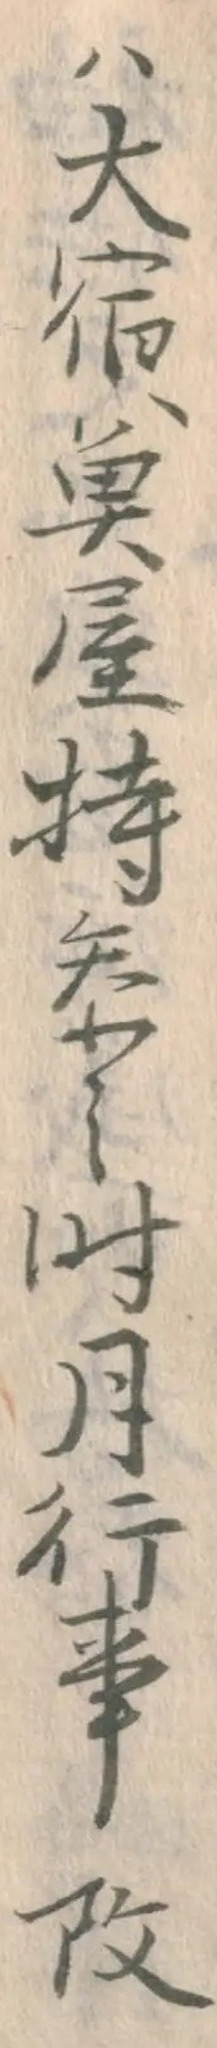は大宿へ魚屋持参之時月行事改
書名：賀茂社記録. 第81冊
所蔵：国立国会図書館 National Diet Library, JAPAN
